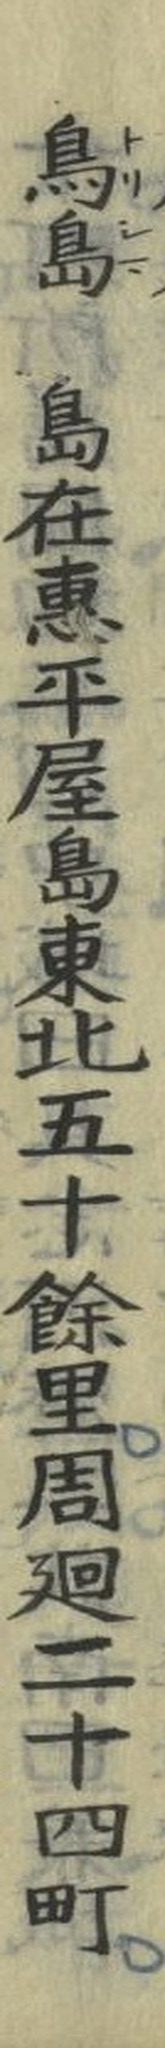鳥島島在惠平屋島東北五十餘里。周廻二十四町。
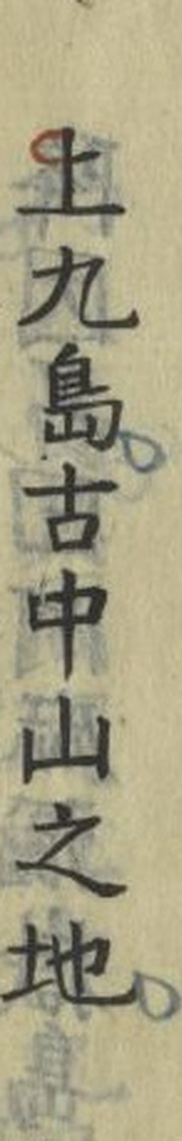上九島。古中山之地。
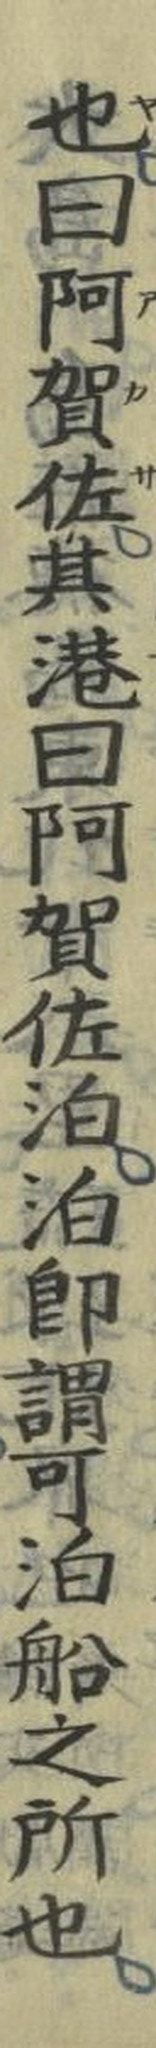也。曰阿賀佐。其港曰阿賀佐泊。泊卽謂可泊船之所也。
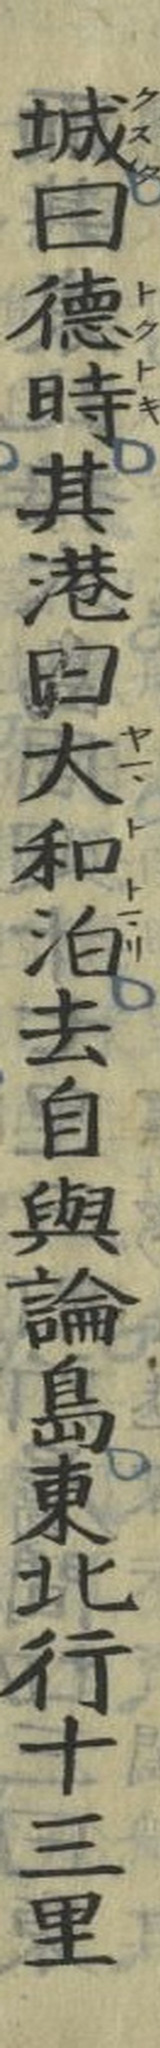城。曰德時。其港曰大和泊。去自與論島。東北行十三里

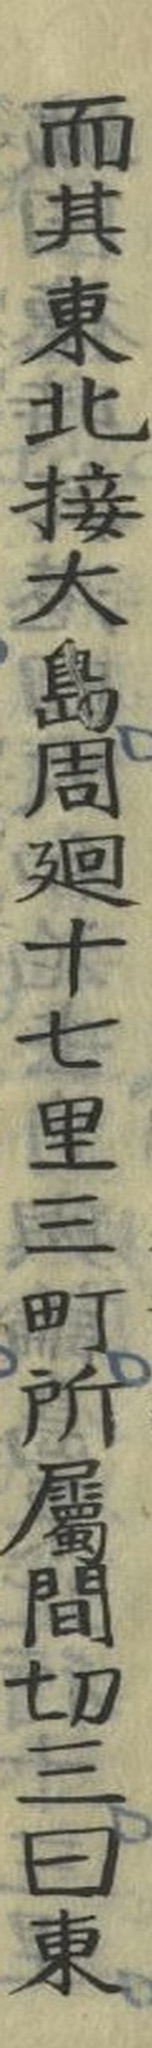而其東北接大島。周廻十七里三町。所屬間切三。曰東。
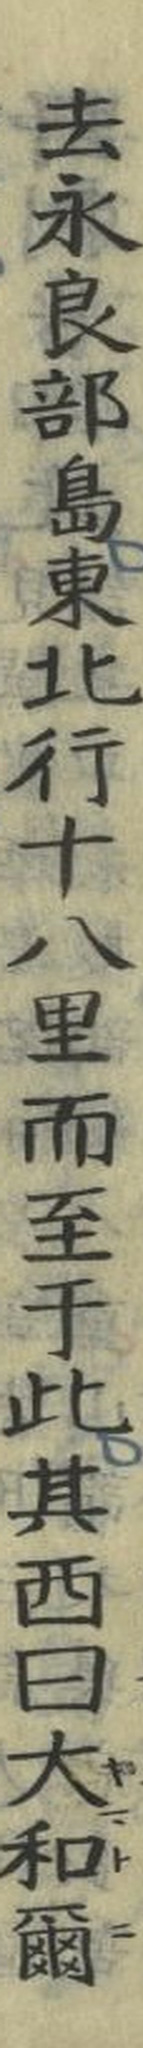去永良部島。東北行十八里而至于此。其西曰大和爾
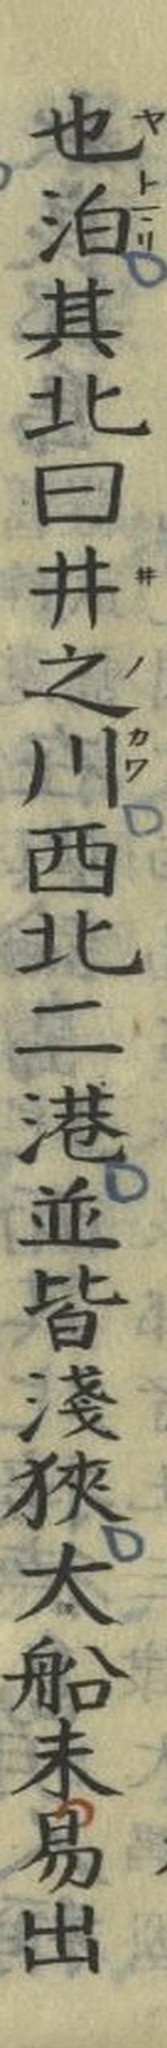也泊。其北曰井之川。西北二港。並皆淺狹。大船未易出
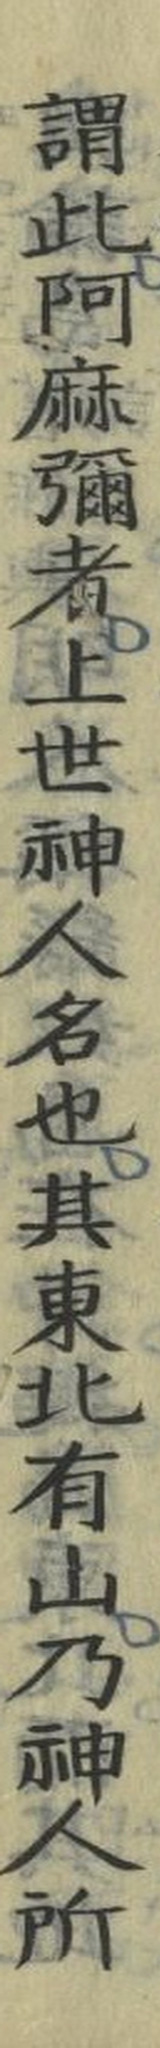謂此。阿麻彌者。上世神人名也。其東北有山。乃神人所
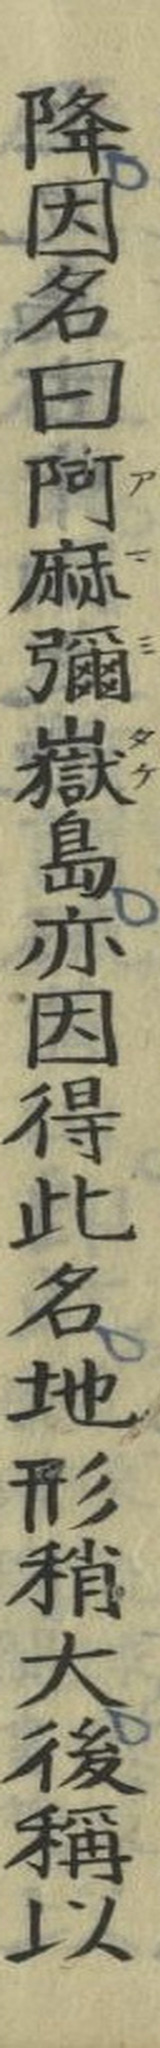降。因名曰阿麻彌嶽島。亦因得此名。地形稍大。後稱以
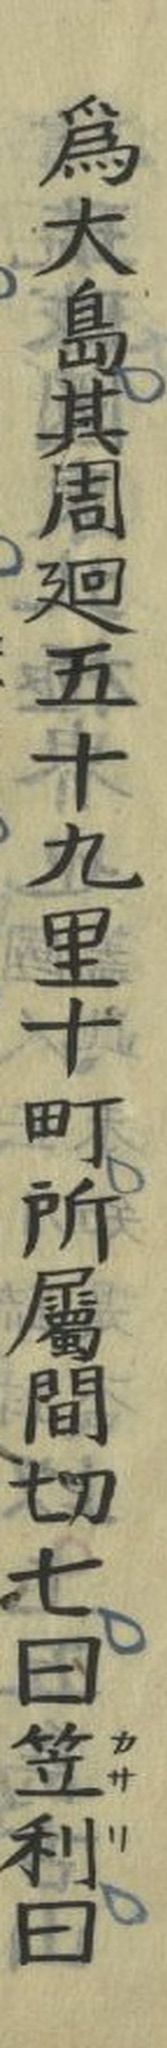爲大島。其周廻五十九里十町。所屬間切七。曰笠利。曰
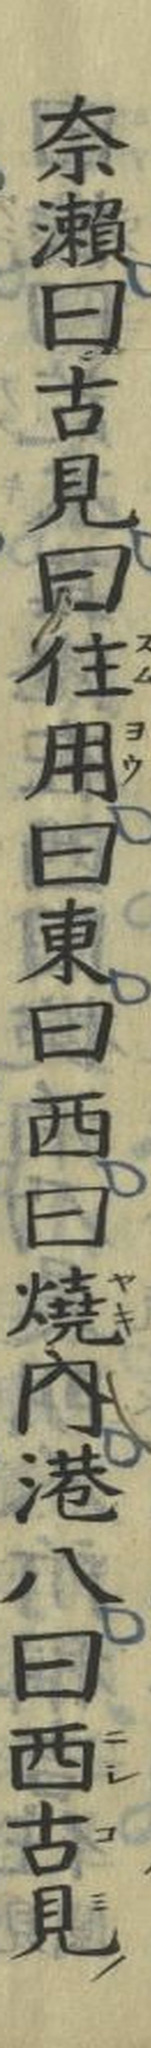奈瀨。曰古見。曰住用。曰東。曰西。曰燒内。港八。曰西古見
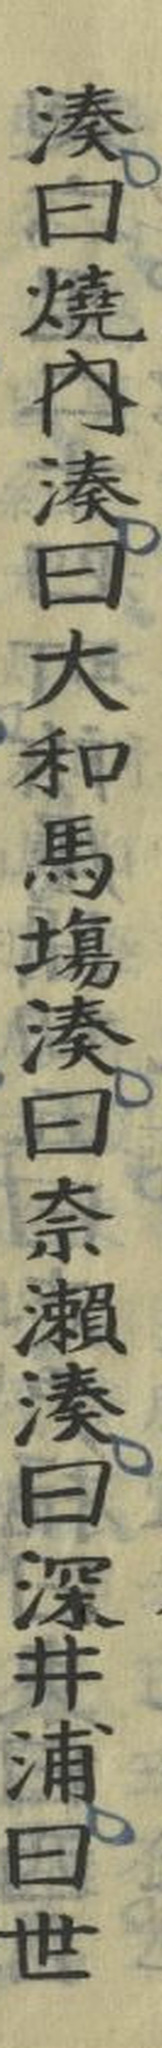湊。曰燒内湊。曰大和馬塲湊。曰奈瀨湊。曰深井浦。曰世
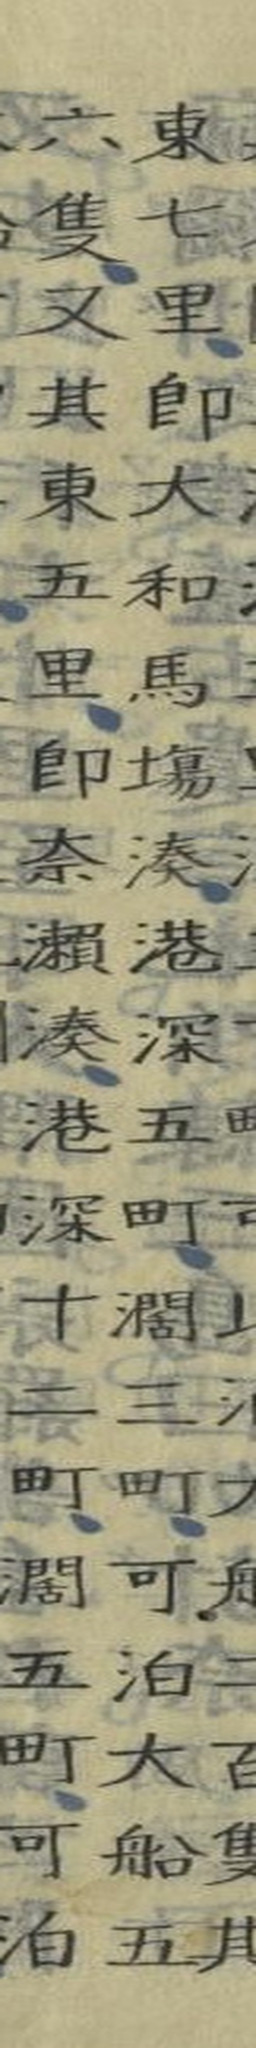六隻。又其東五里。卽奈瀨湊。港深十二町。濶五町。可泊

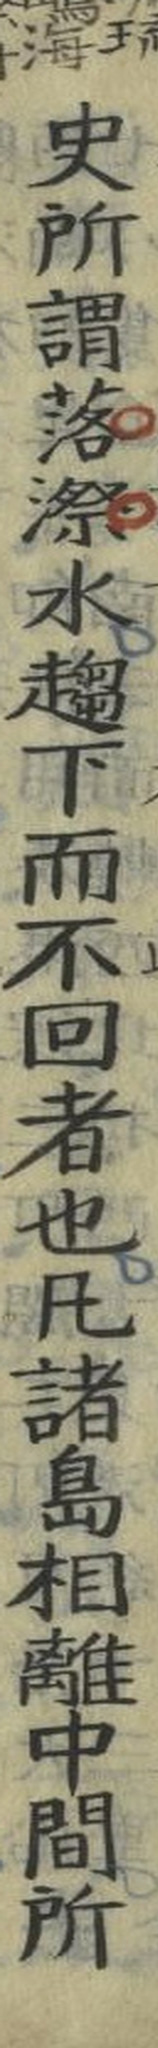史所謂落漈水。趨下而不回者也。凡諸島相離中間。所
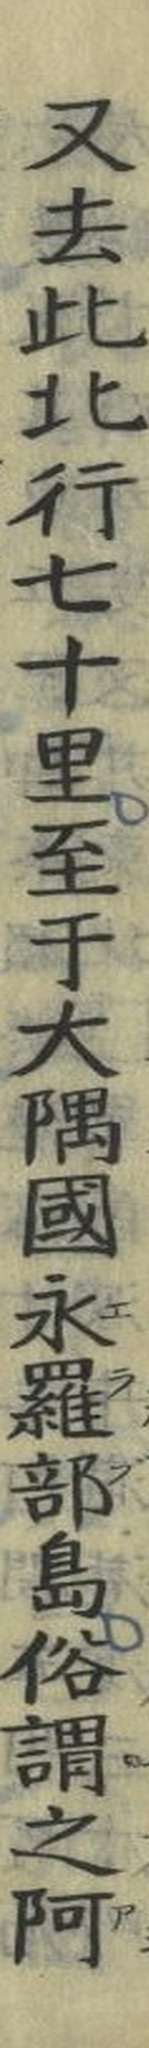又去此北行七十里。至于大隅國永羅部島。俗謂之阿
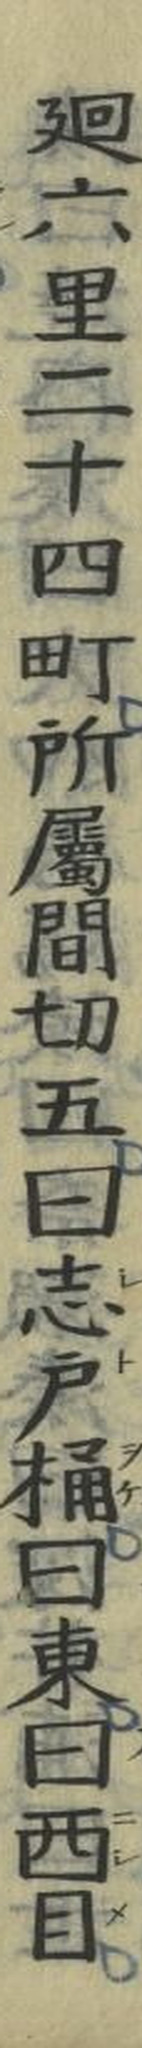廻六里二十四町。所屬間切五。曰志戸桶。曰東。曰西目。
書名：南島志
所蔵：University of the Ryukyus Library
